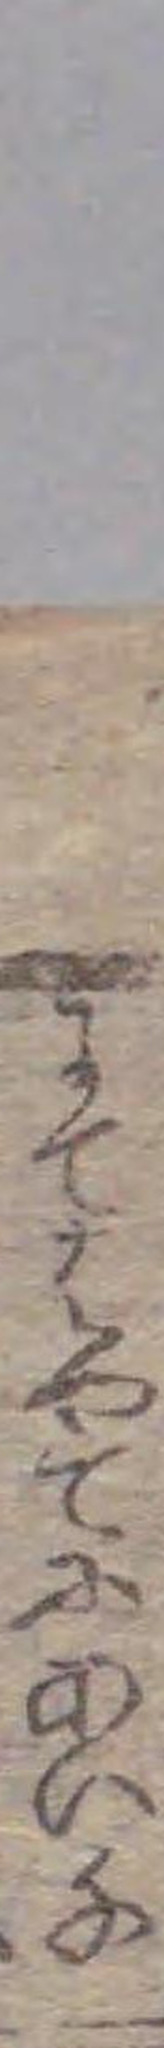にてはやてにあい千
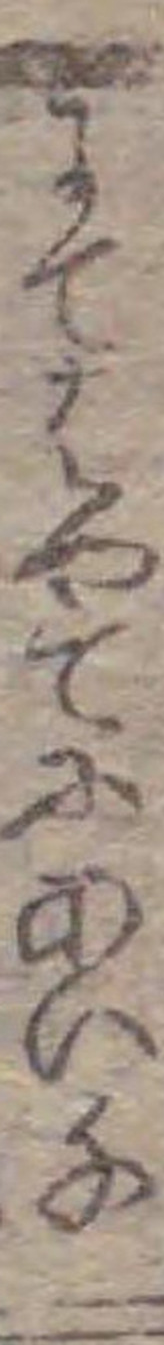にてはやてにあい千
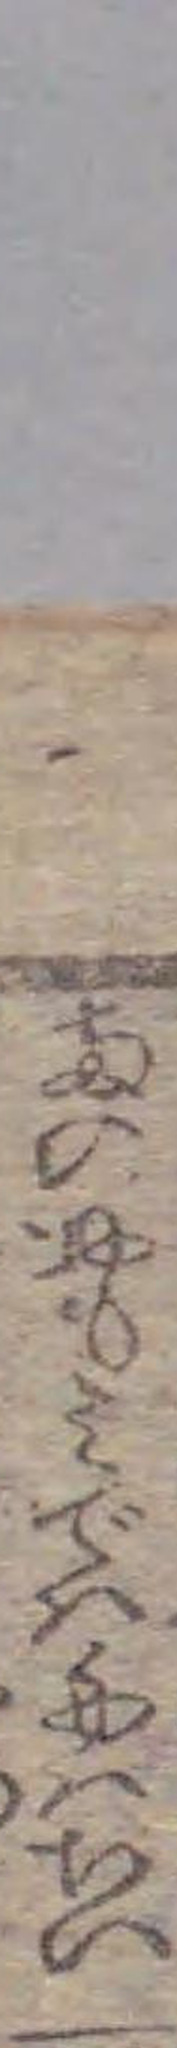両のおもみでは舟はちい
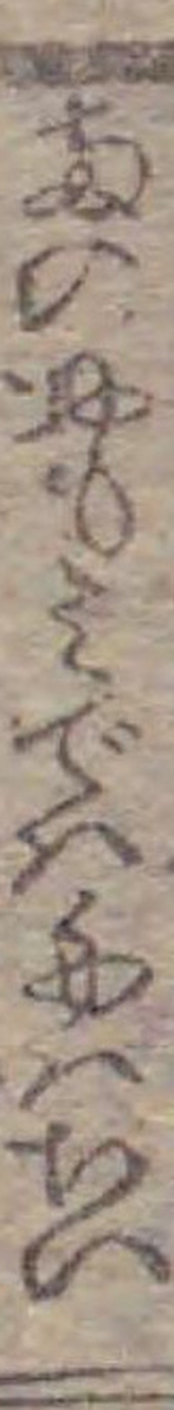両のおもみでは舟はちい
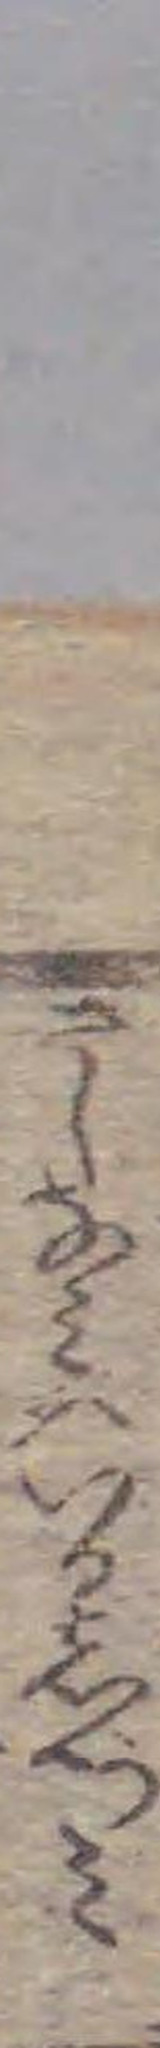さしなみはいるしつみ
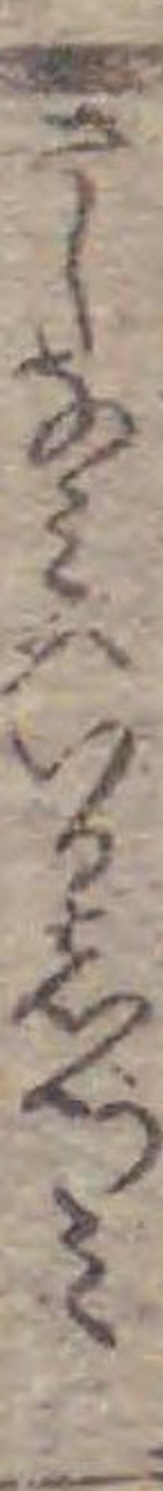さしなみはいるしつみ
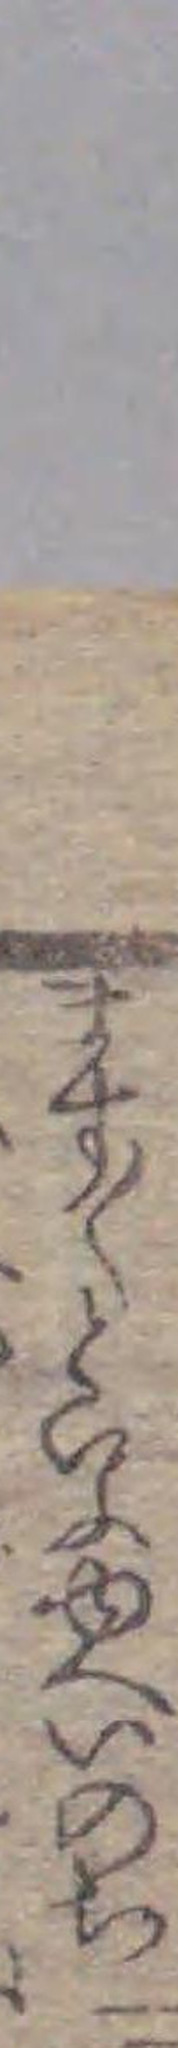ます〳〵といふゆへいのち
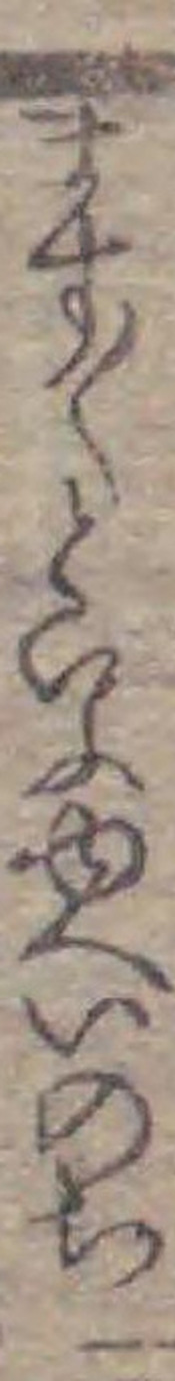ます〳〵といふゆへいのち
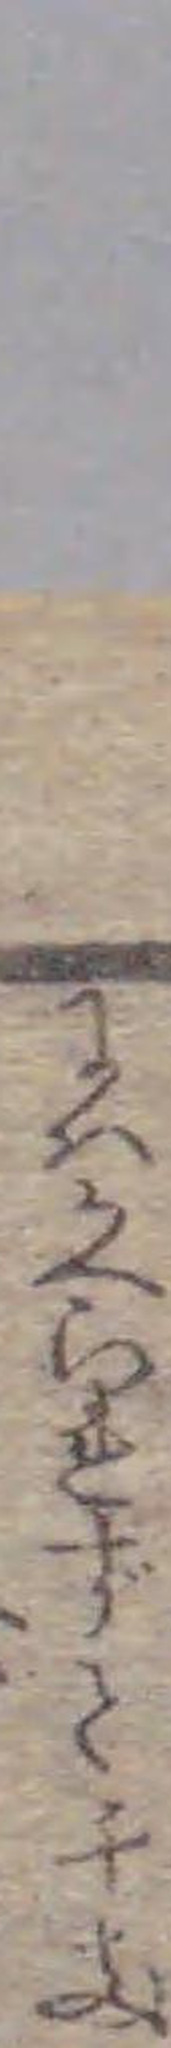にはかへられずと千両
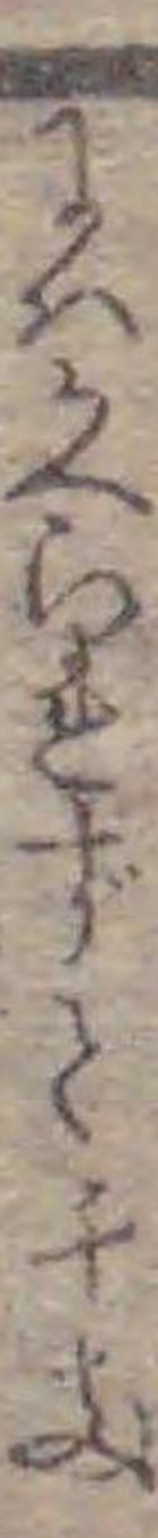にはかへられずと千両
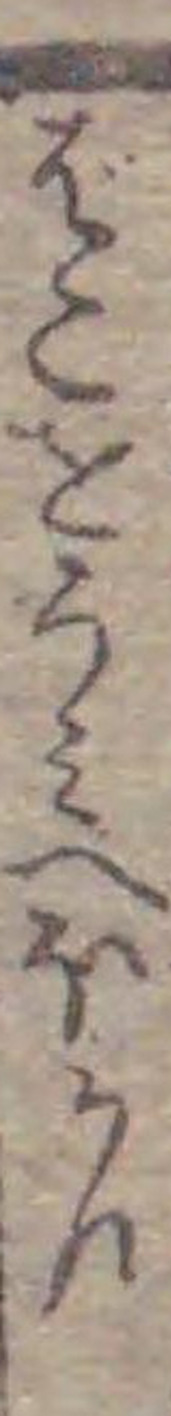ばこをうみへほうり
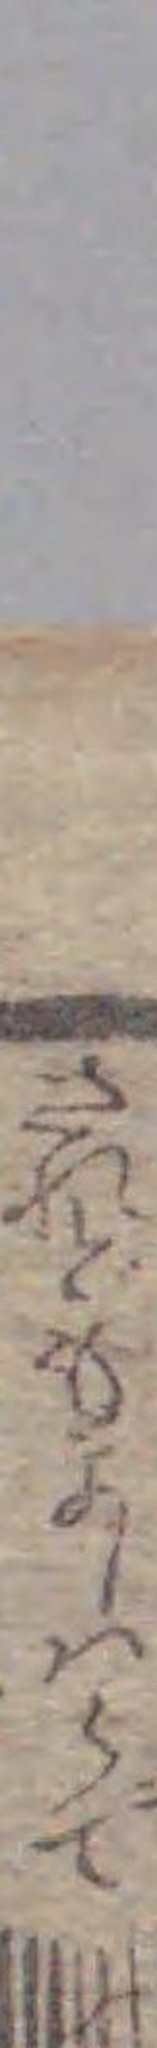されどもよしはらにて
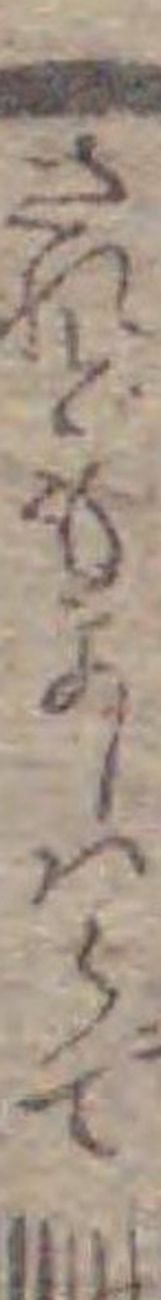されどもよしはらにて
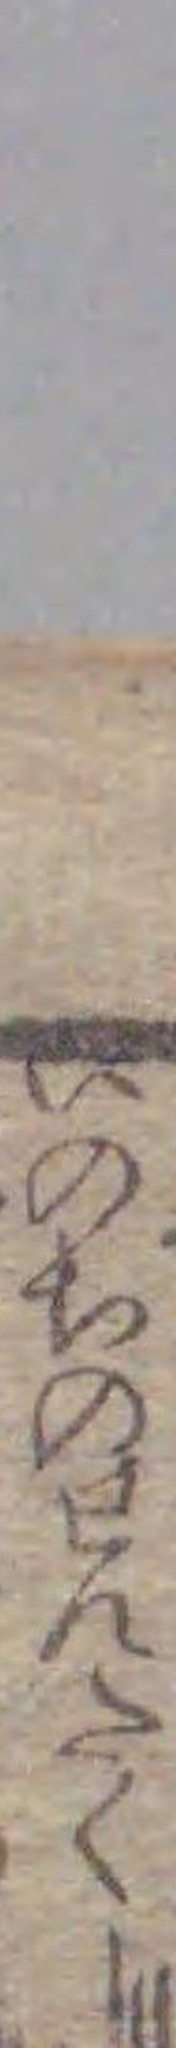いのちのせんたく
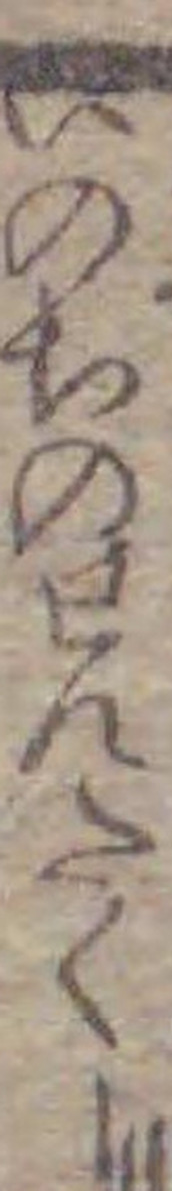いのちのせんたく
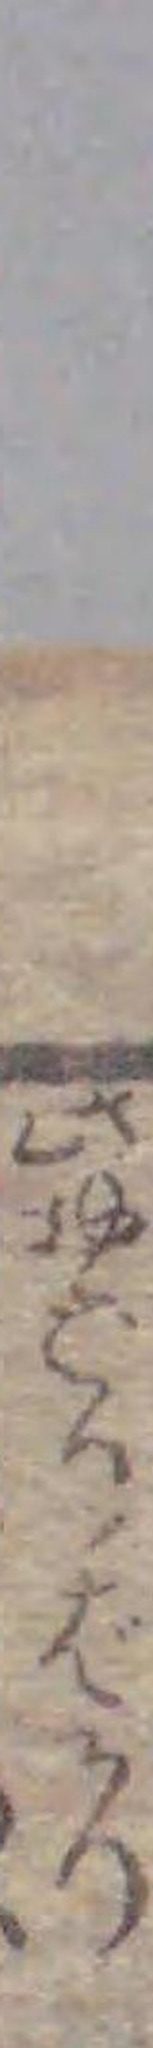此おごりばかり
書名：紺屋百物語 : 3巻
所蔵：国立国会図書館 National Diet Library, JAPAN
